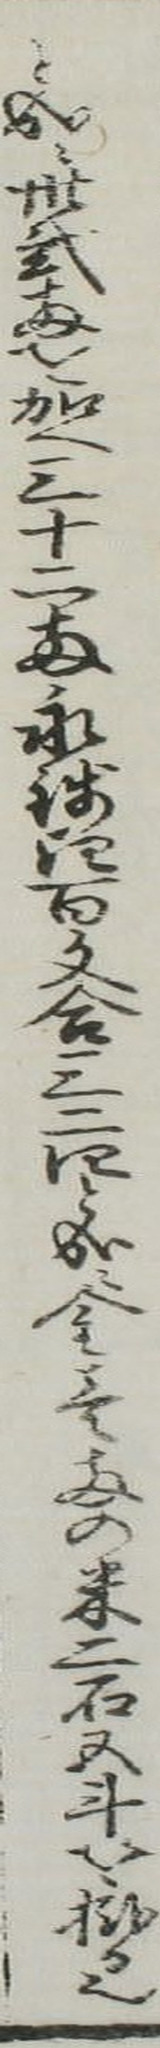と成に卅弐両を加へ三十二両永銭四百文合三二四と成に金壱両の米二石五斗を掛る也
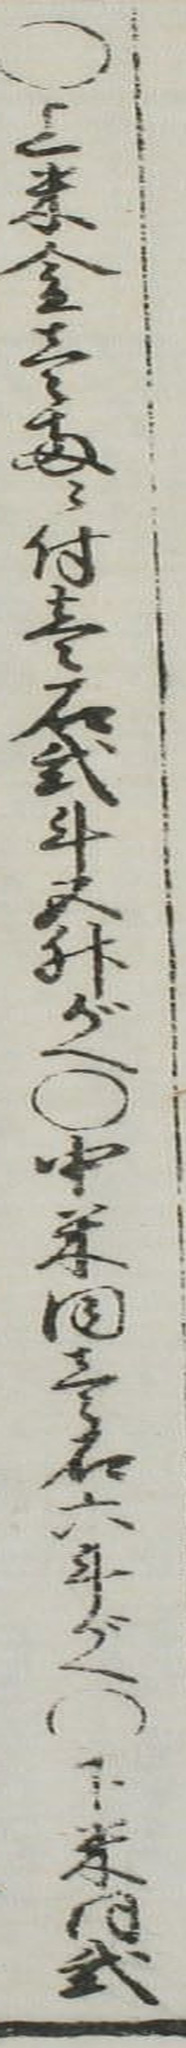○上米金壱両に付壱石弐斗五升がへ○中米同壱石六斗がへ○下米同弐
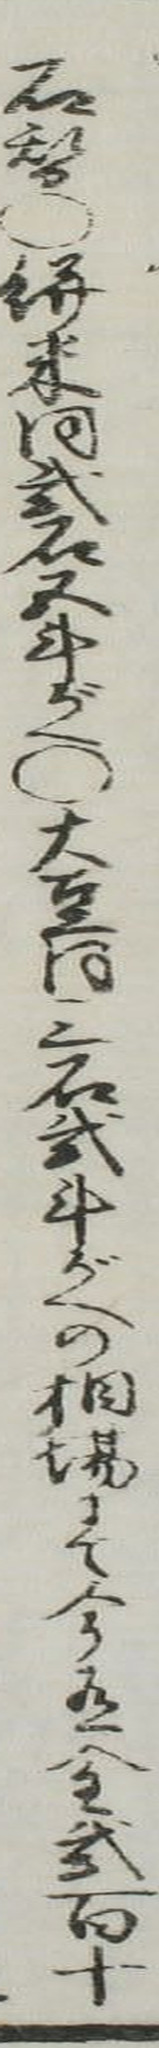石替○餅米同弐石五斗がへ○大豆同三石弐斗がへの相場にて今有金弐百十
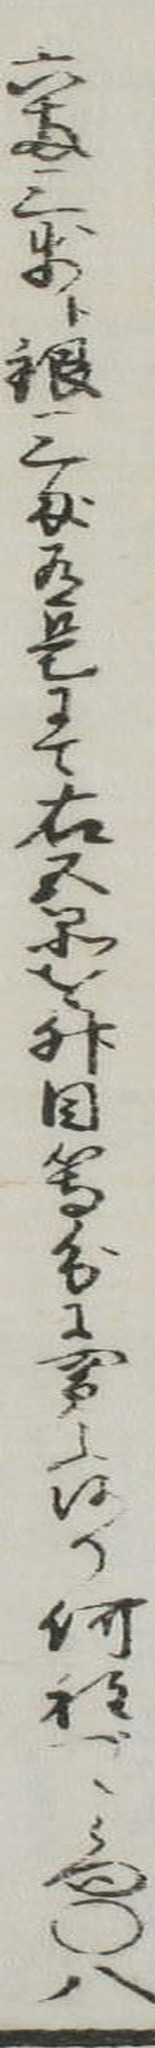六両三歩と銀三匁有是にて右五品を升目等分に買ふあり何程づゝと問○八
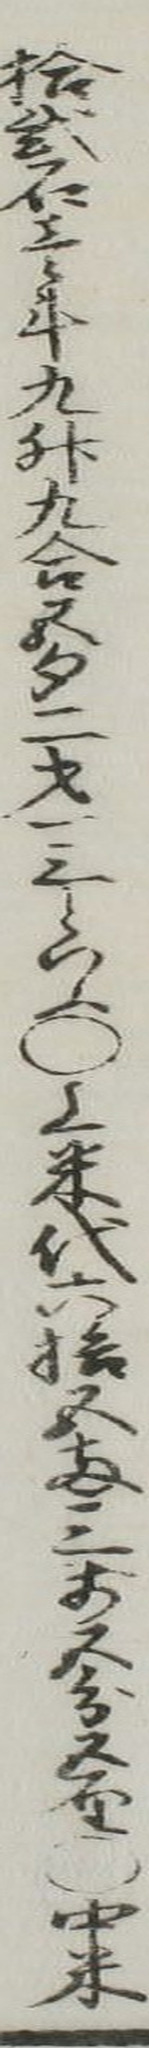拾弐石壱斗九升五合五勺二才一三といふ○上米代六拾五両三歩五分五厘○中米
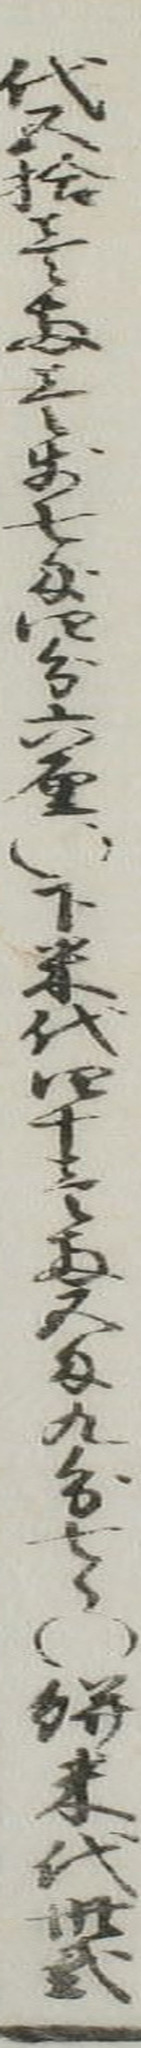代五拾壱両壱歩七匁四分六厘○下米代四十壱両五匁九分七厘○餅米代卅弐
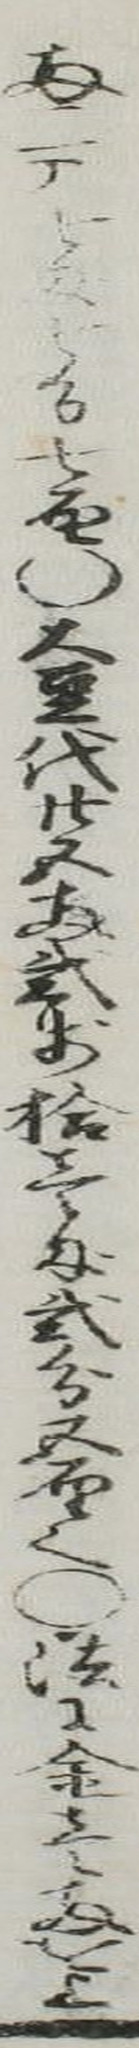両七匁七分七厘○大豆代廿五両弐歩拾壱匁弐分五厘也○法に金壱両を上
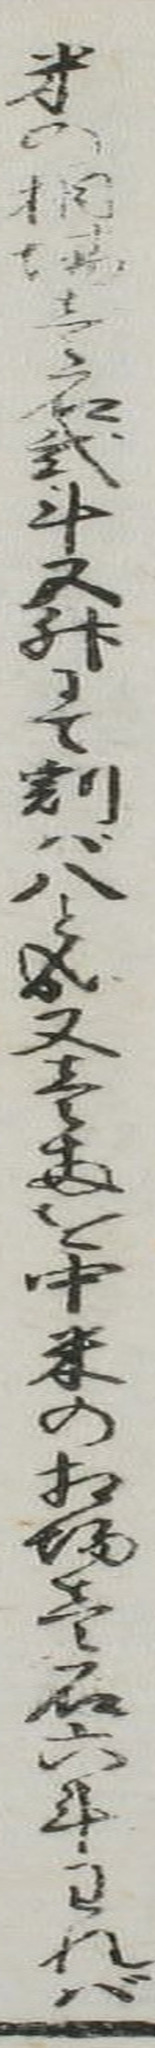米の相場壱石弐斗五升にて割ば八と成又壱両を中米の相場壱石六斗われば
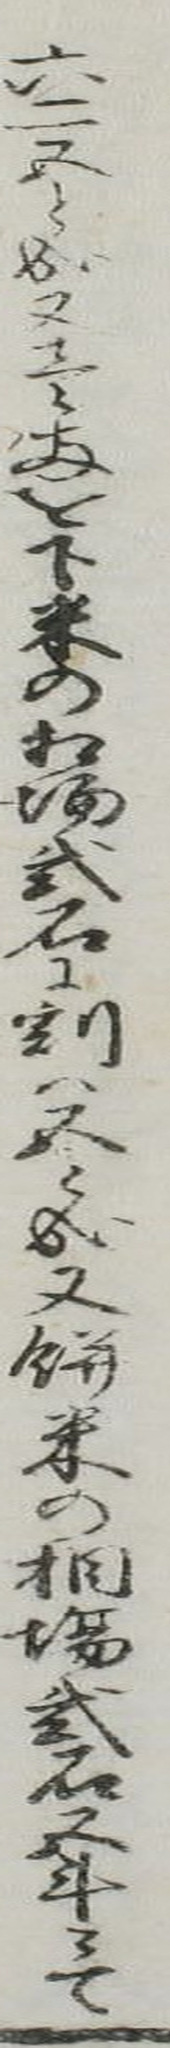六二五と成又壱両を下米の相場壱石に割は五と成又餅米の相場弐石五斗にて
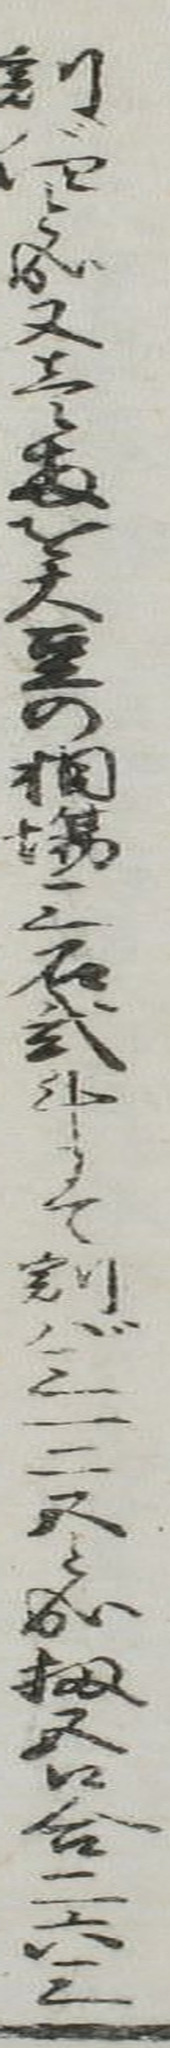割ば四と成又壱両を大豆の相場三石弐斗にて割ば三一二五と成扨五口合二六三
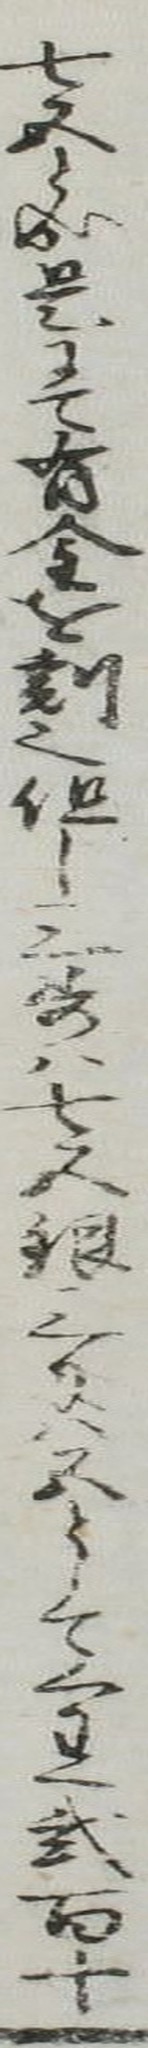七五と成是にて有金を割也但し三歩は七五銀三匁は五としてくわへ弐百十
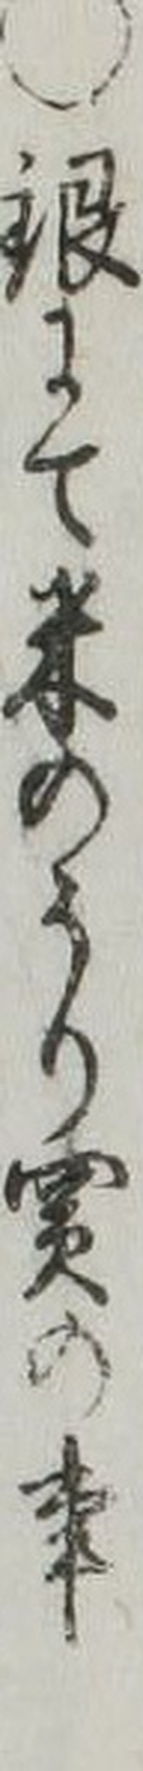○銀にて米のうり買の事
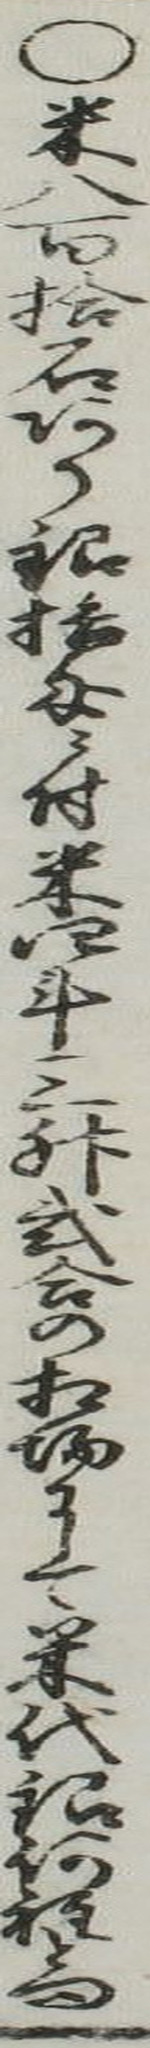○米八百拾石あり銀拾匁に付米四斗三升弐合の相場にて米代銀何程と問
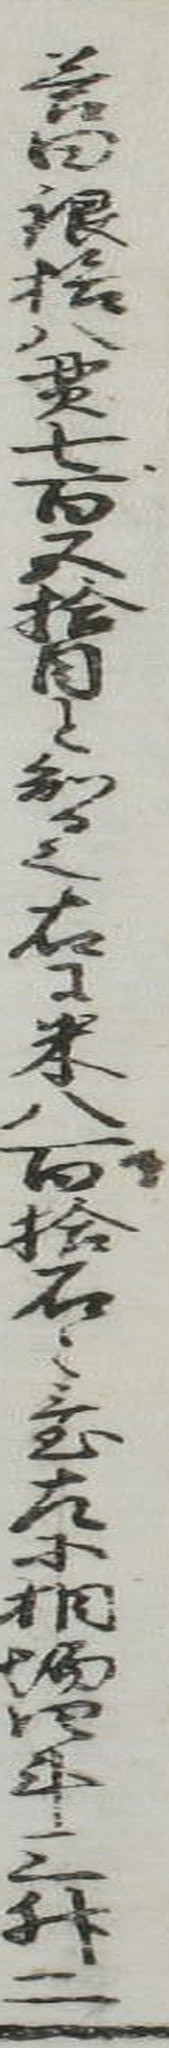答曰銀拾八貫七百五拾目と知る也右に米八百拾石と置左に相場四斗三升二
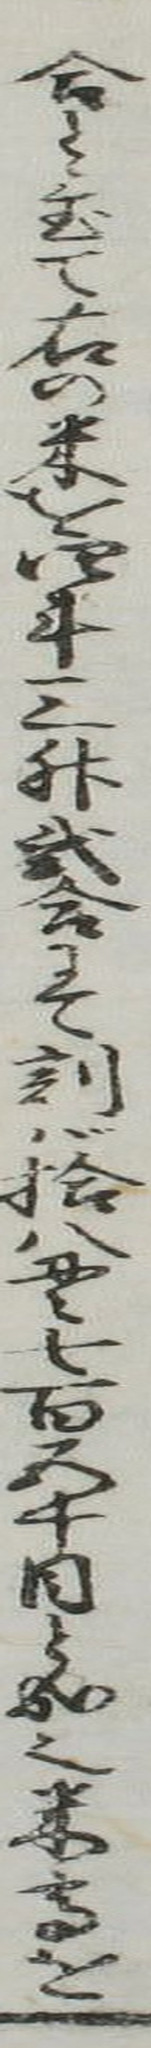合と置て右の米を四斗三升弐合にて割ば拾八貫七百五十目と成也米高を
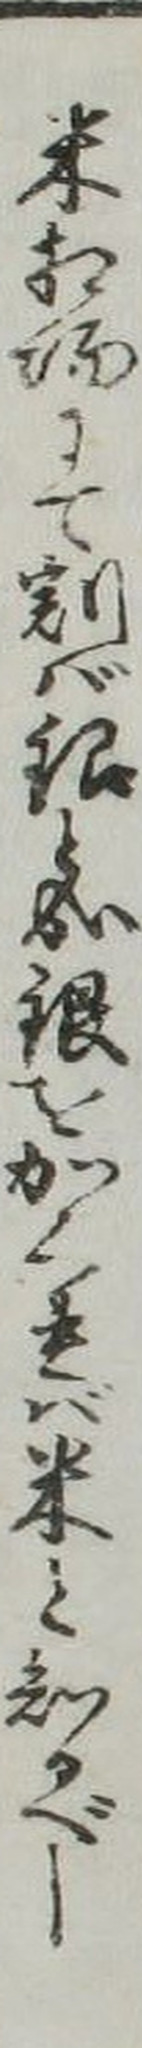米相場にて割ば銀と成銀をかくれば米と知るべし
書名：宝玉塵劫記
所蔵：東京学芸大学教育コンテンツアーカイブ
